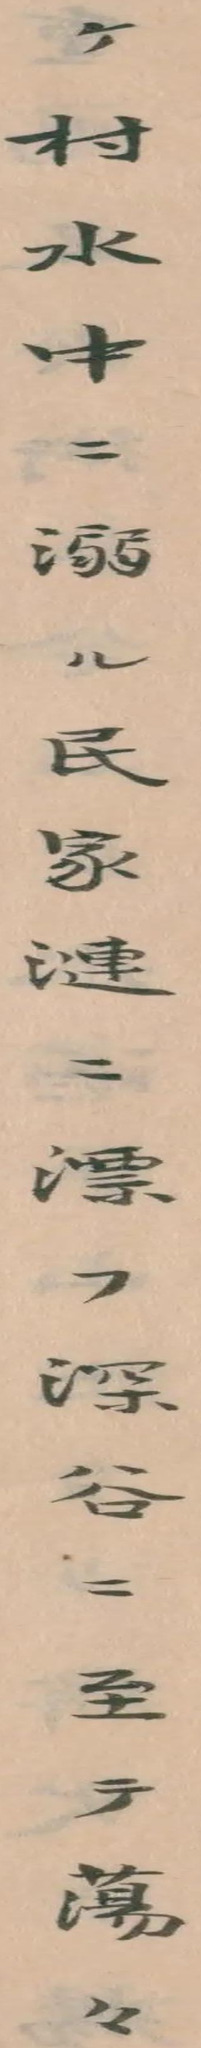ケ村水中ニ溺ル民家漣ニ漂フ深谷ニ至テ蕩々
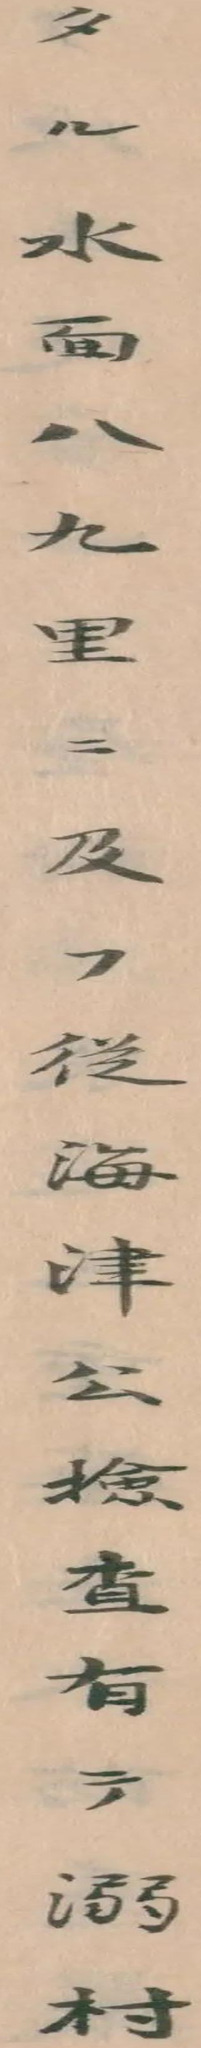タル水面八九里ニ及フ従海津公検査有テ溺村
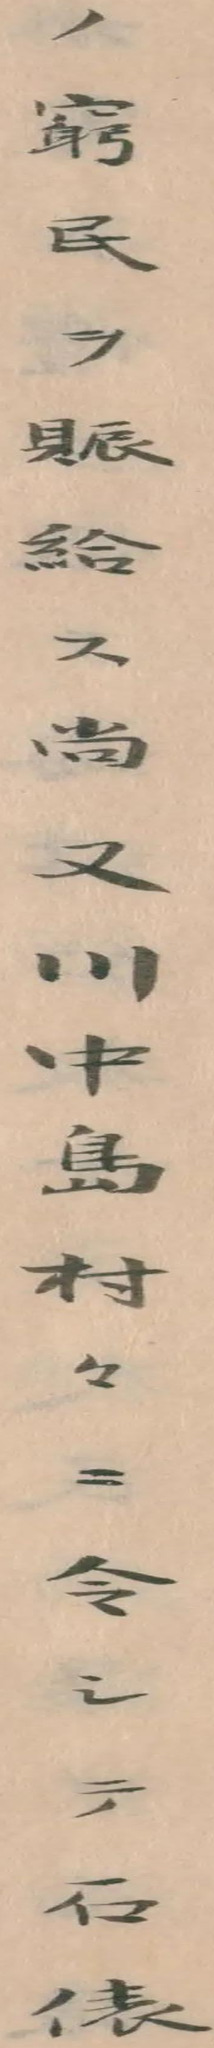ノ窮民ヲ賑給ス尚又川中島村々ニ令シテ石俵
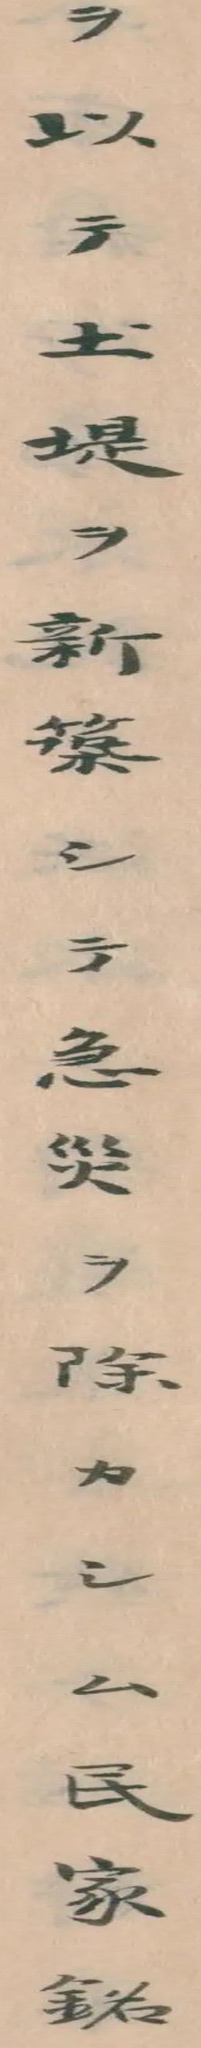ヲ以テ土堤ヲ新築シテ急災ヲ除カシム民家銘
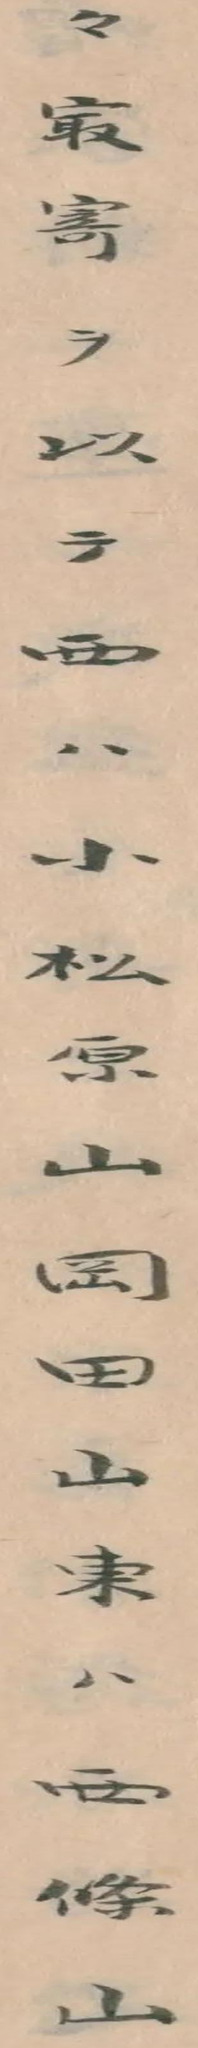々最寄ヲ以テ西ハ小松原山岡田山東ハ西條山
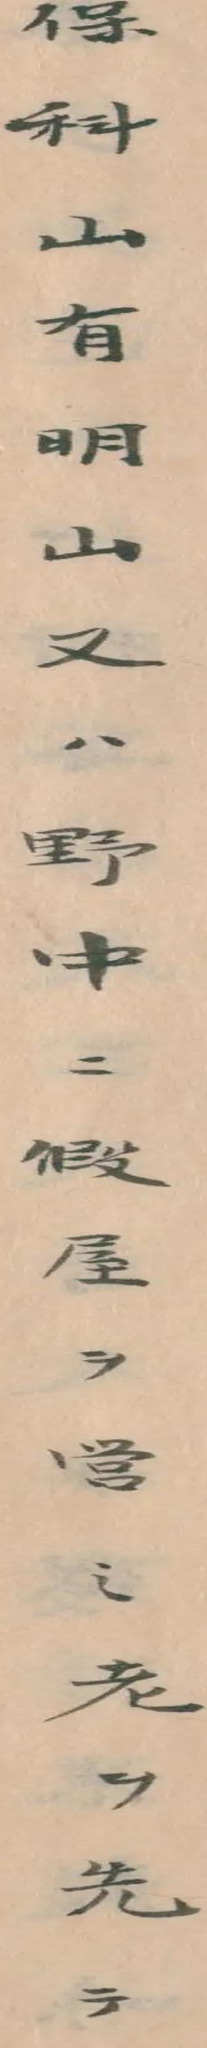保科山有明山又ハ野中ニ仮屋ヲ営ミ老ヲ先テ

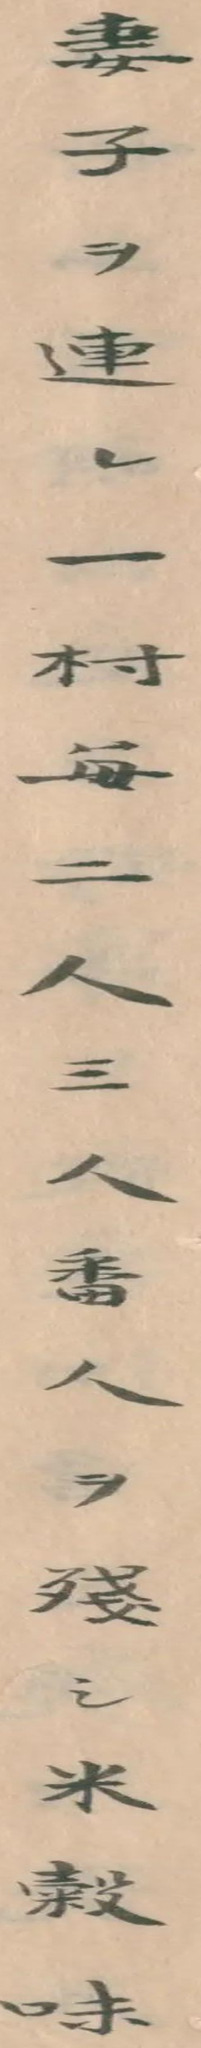妻子ヲ連レ一村毎二人三人番人ヲ残シ米穀味
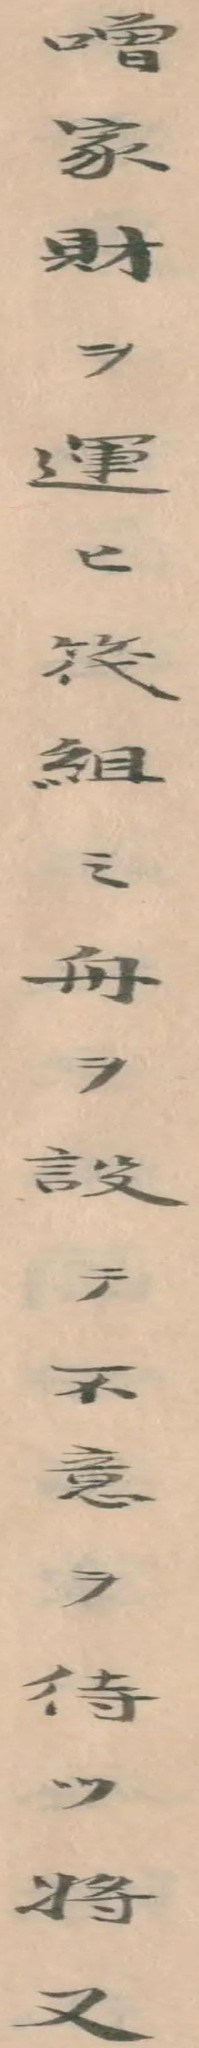噌家財ヲ運ヒ筏組ミ舟ヲ設テ不意ヲ待ツ将又
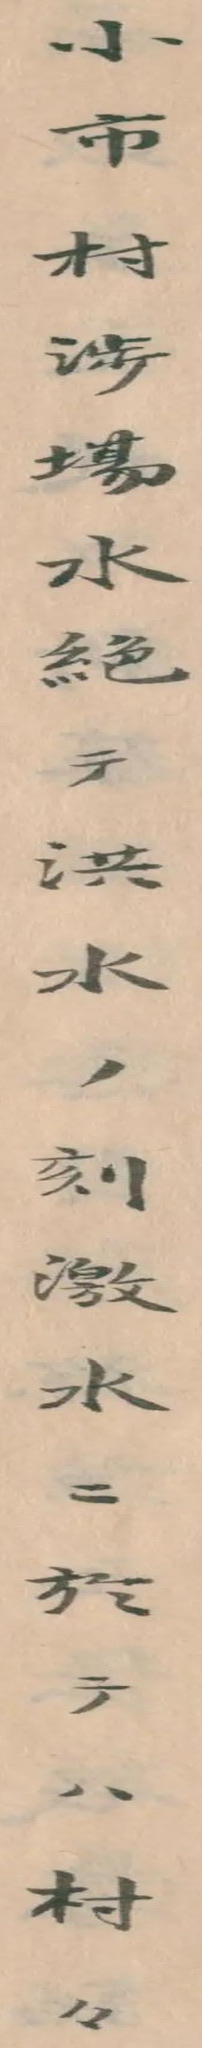小市村渉場水絶テ洪水ノ刻激水ニ於テハ村々
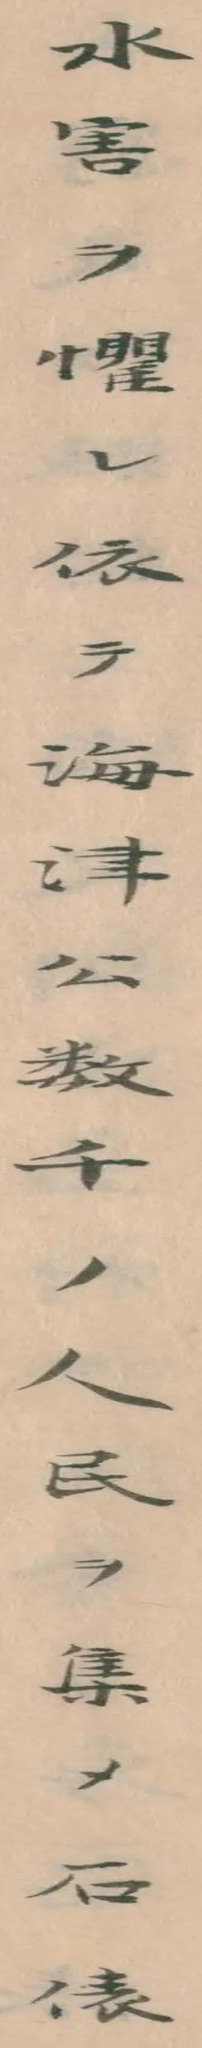水害ヲ懼レ依テ海津公数千ノ人民ヲ集メ石俵
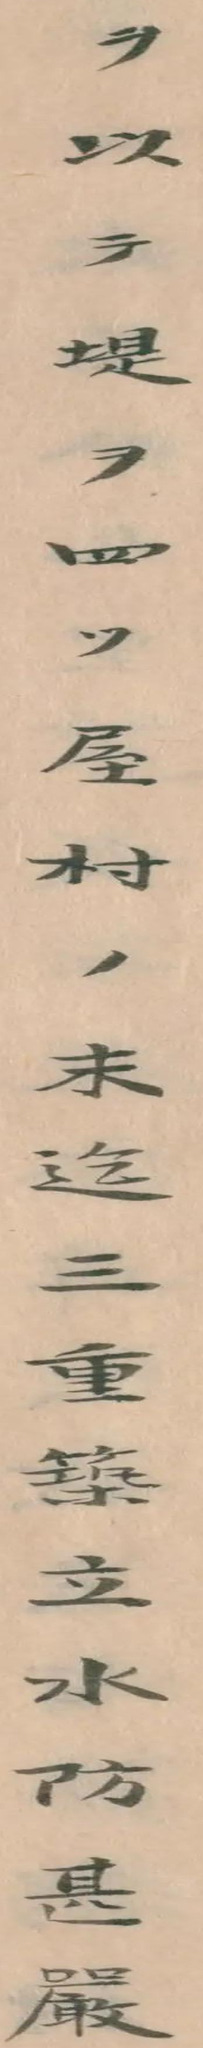ヲ以テ堤ヲ四ツ屋村ノ末迄三重築立水防甚厳
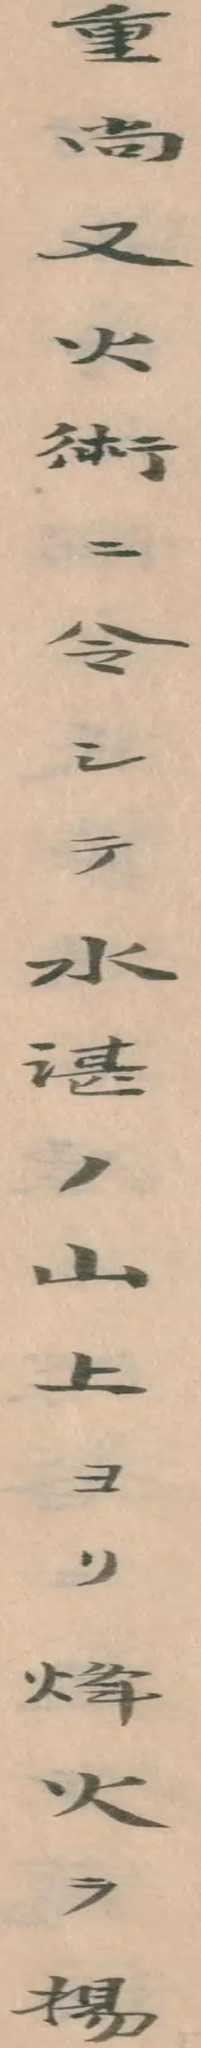重尚又火術ニ令シテ水湛ノ山上ヨリ烽火ヲ揚
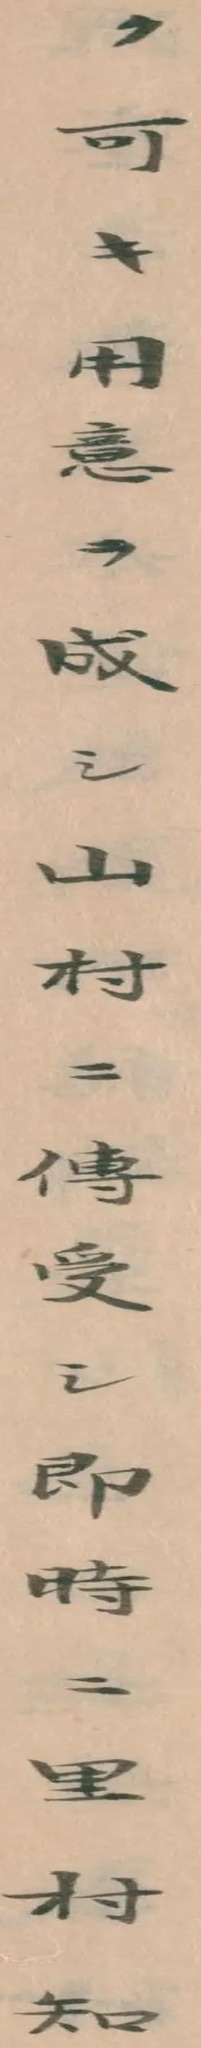ク可キ用意ヲ成シ山村ニ伝授シ即時ニ里村知
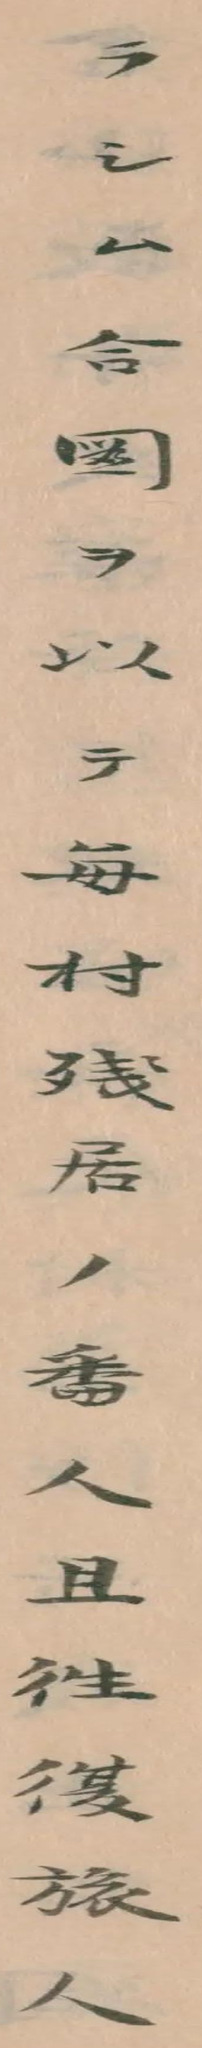ラシム合図ヲ以テ毎村残居ノ番人且往復旅人
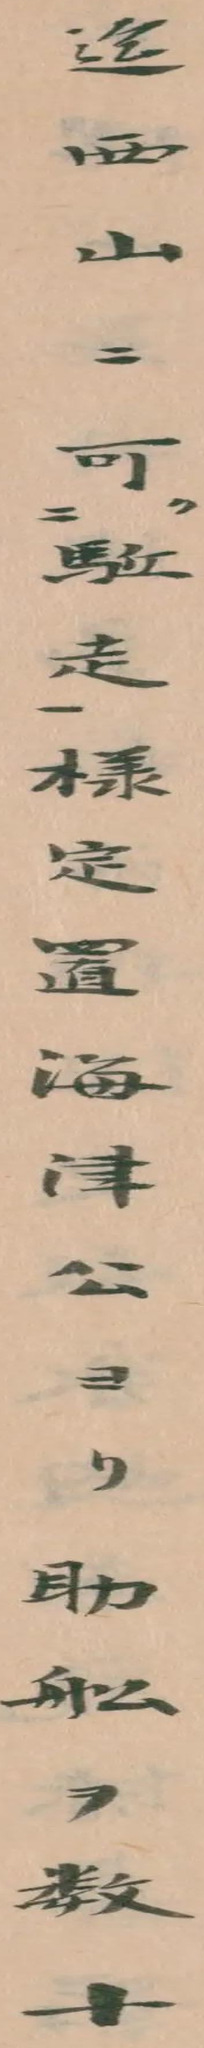迄西山ニ可駈走様定置海津公ヨリ助船ヲ数十
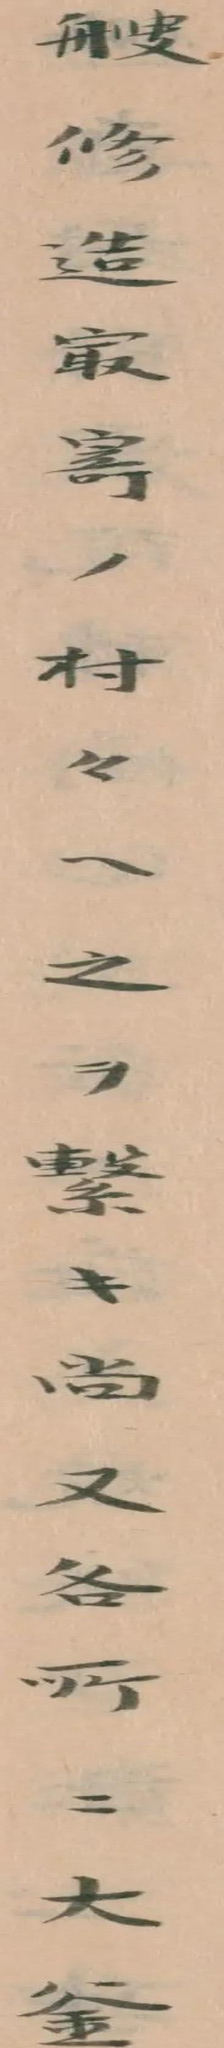艘修造最寄ノ村々ヘ之ヲ繋キ尚又各所ニ大釜
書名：地災撮要. 巻5-6(地震之部)
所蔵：国立国会図書館 National Diet Library, JAPAN
